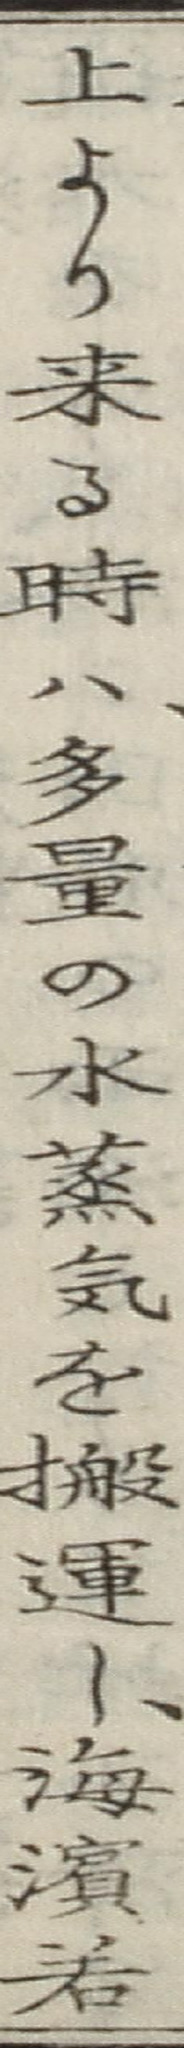上より来る時は、多量の水蒸気を搬運し、海浜若
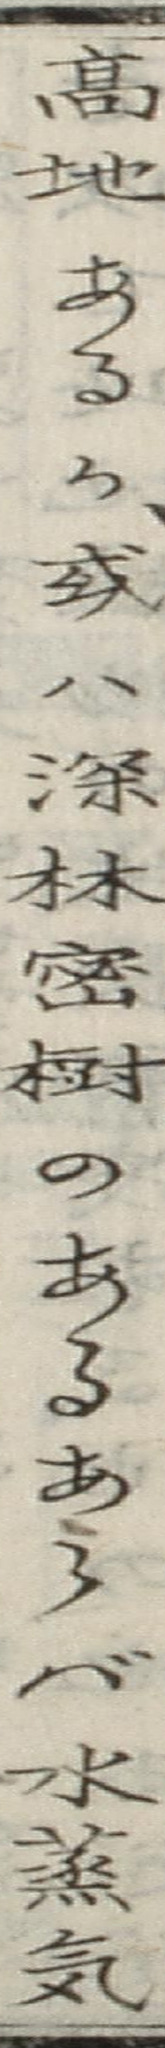高地あるか、或は深林密樹のあるあらば、水蒸気
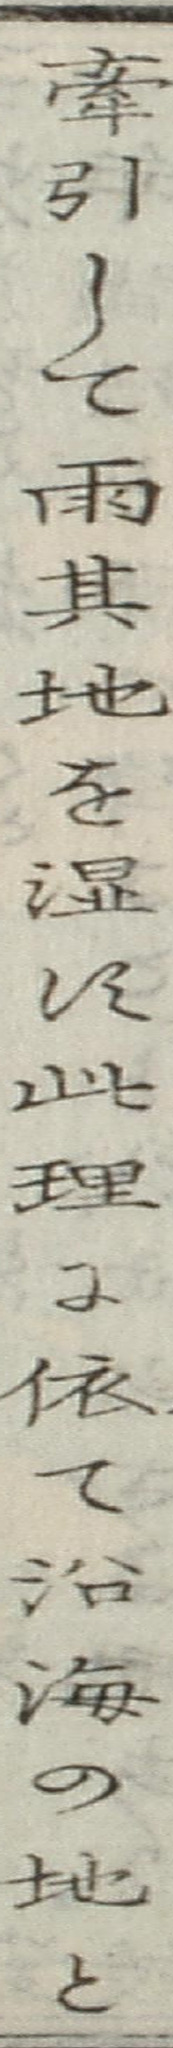牽引して雨其地を湿す、此理に依て沿海の地と
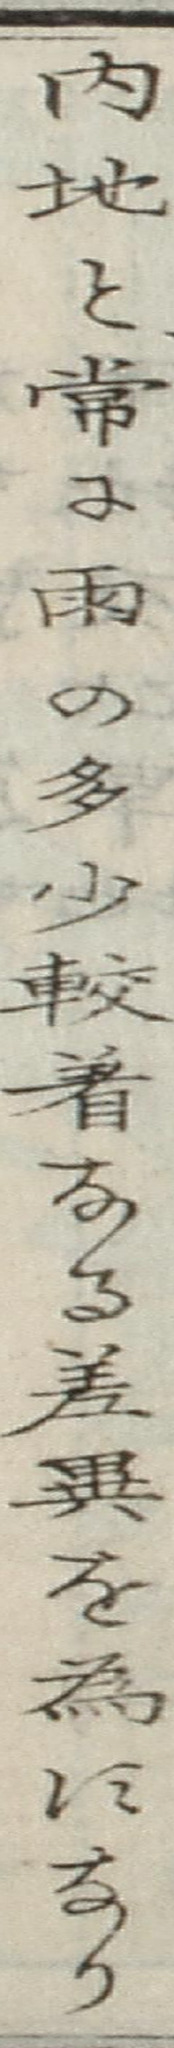内地と、常に雨の多少較著なる差異を為すなり
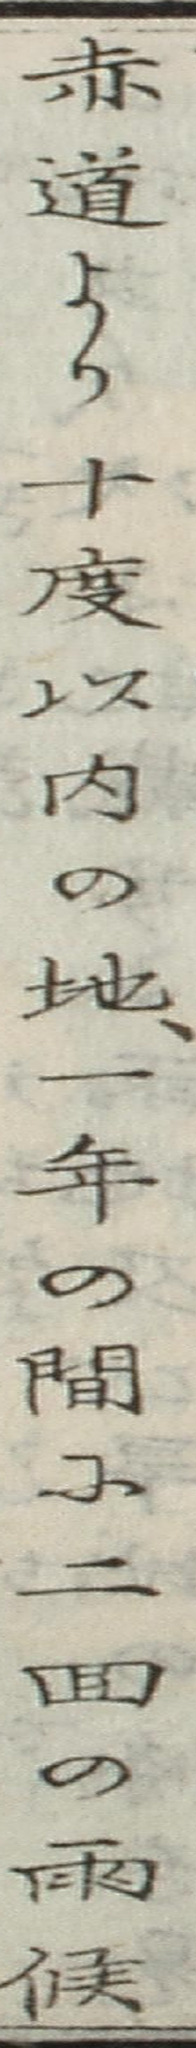赤道より十度以内の地、一年の間に二回の雨候
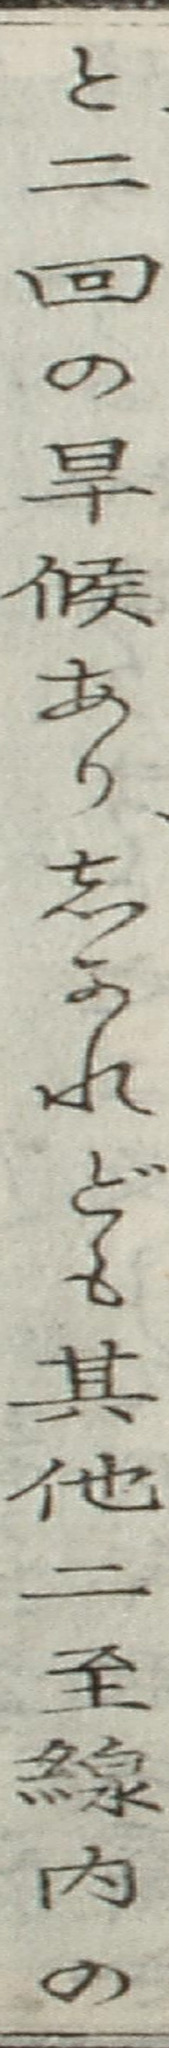と、二回の旱候あり、しかれども其他二至線内の
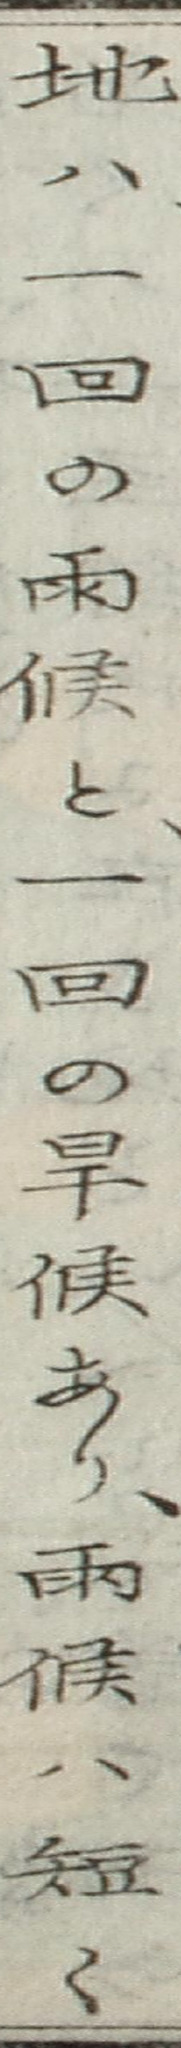地は、一回の雨候と、一回の旱候あり、雨候は短く
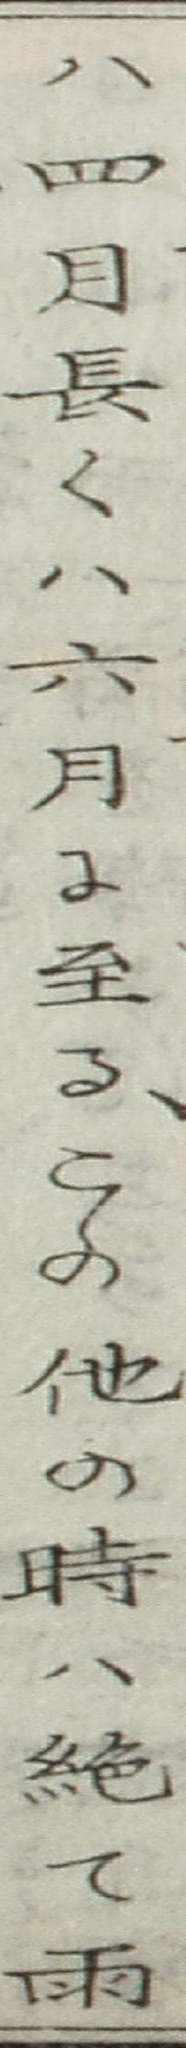は四月長くは六月に至る、この他の時は絶て雨
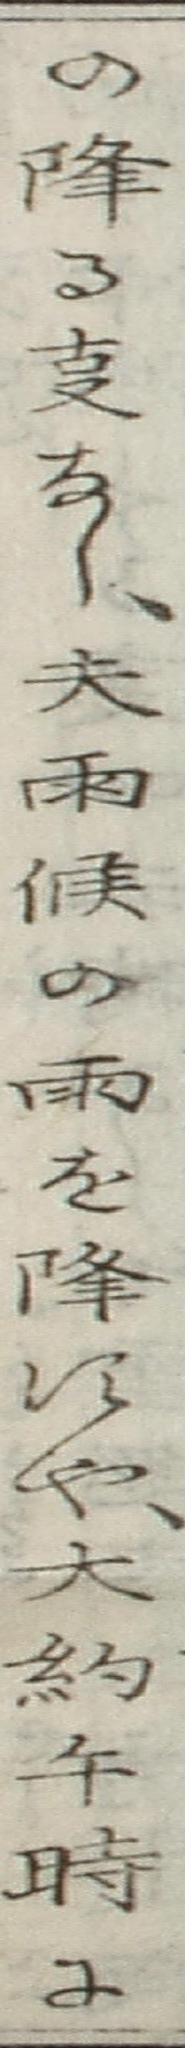の降る事なし、夫雨候の雨を降すや、大約午時に

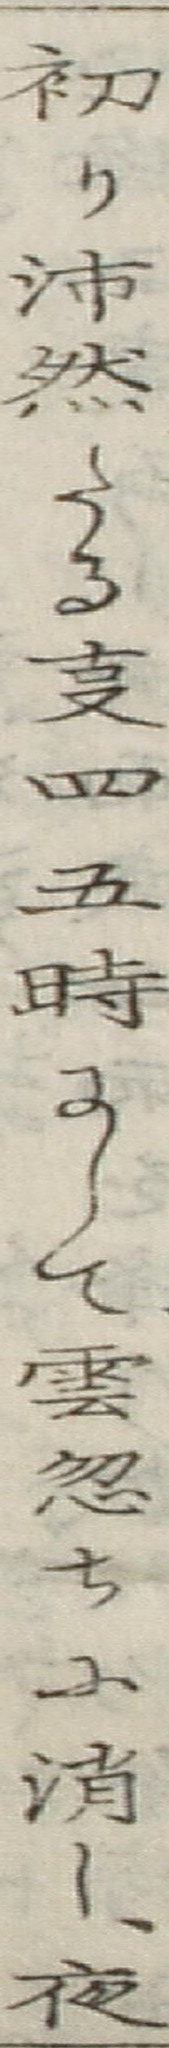初り沛然たる事四五時にして、雲忽ちに消し、夜
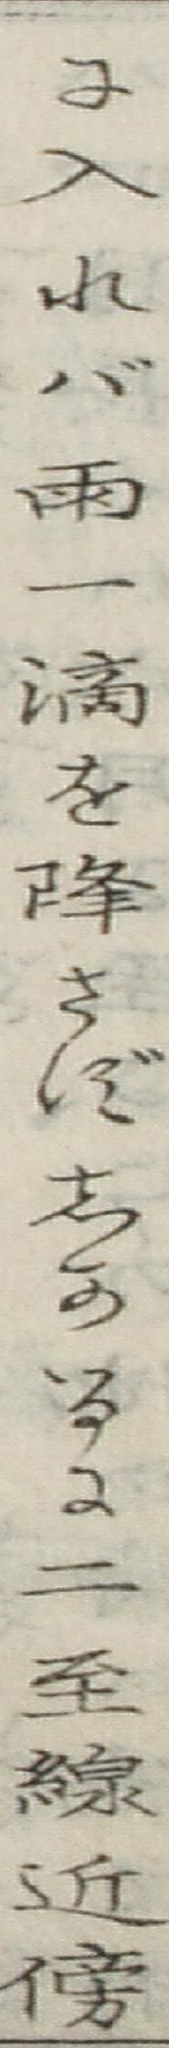に入れば雨一滴を降さず、しかるに二至線近傍
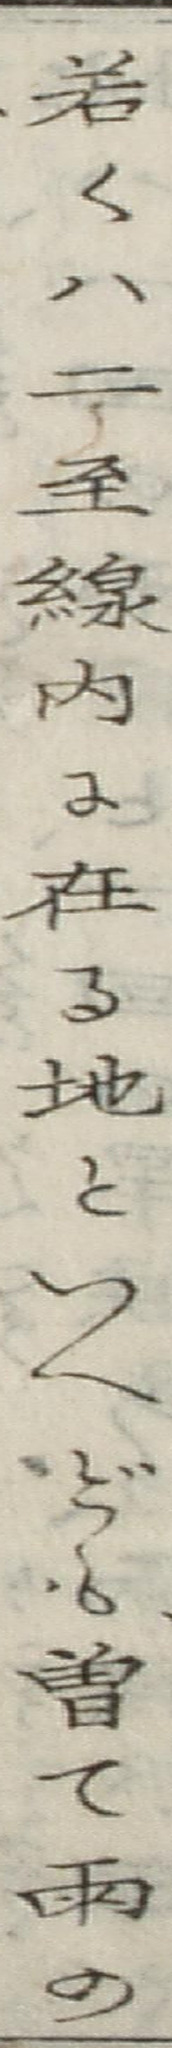若くは二至線内に在る地といへども、曽て雨の
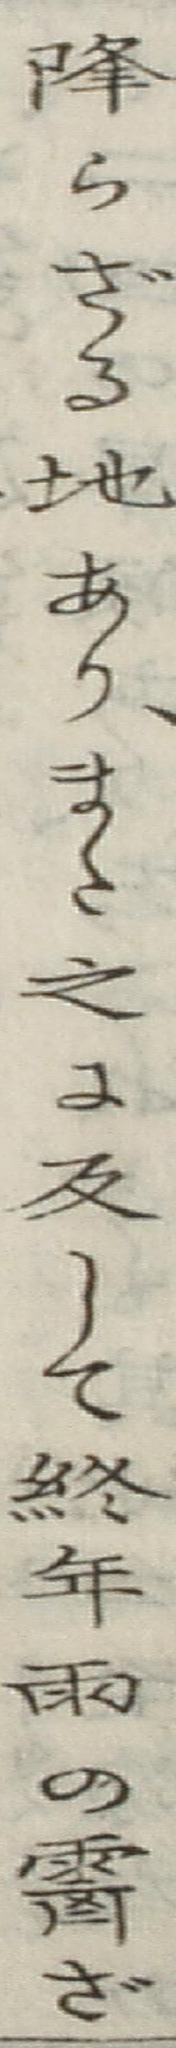降らざる地あり、また之に反して終年雨の霽ざ
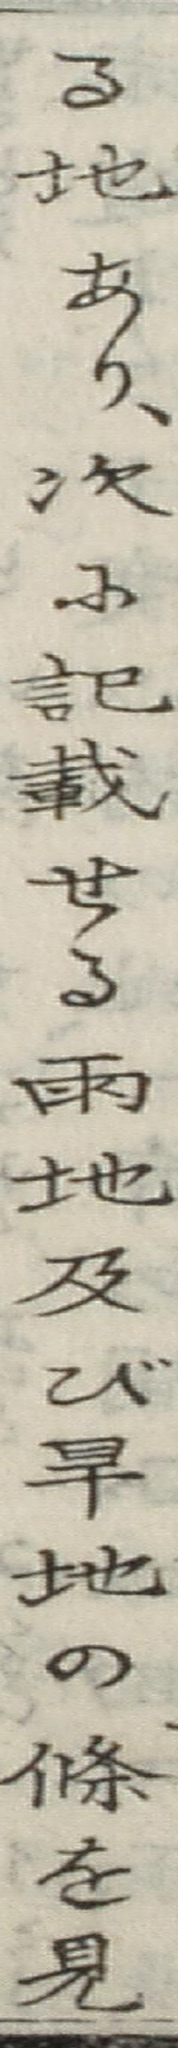る地あり、次に記載せる雨地及び旱地の條を見
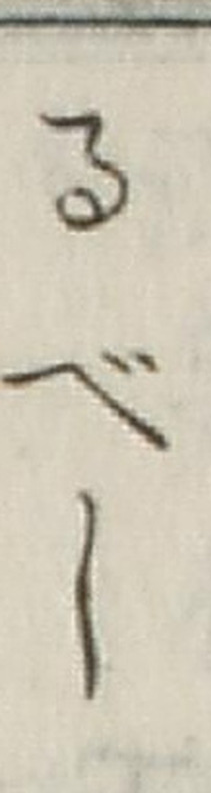るべし
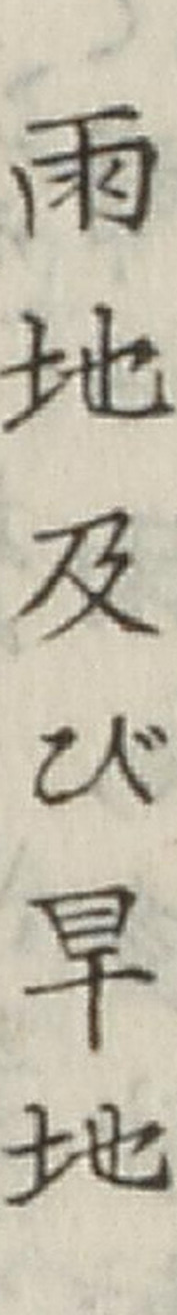雨地及び旱地
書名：訓蒙　天然地理學　下
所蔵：東京大学地震研究所図書室 Earthquake Research Institute Library, The University of Tokyo, JAPAN
